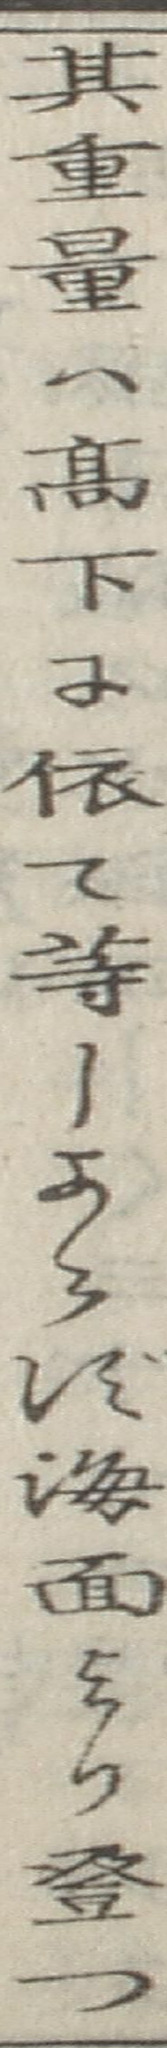其重量は高下に依て等しからず、海面より登つ
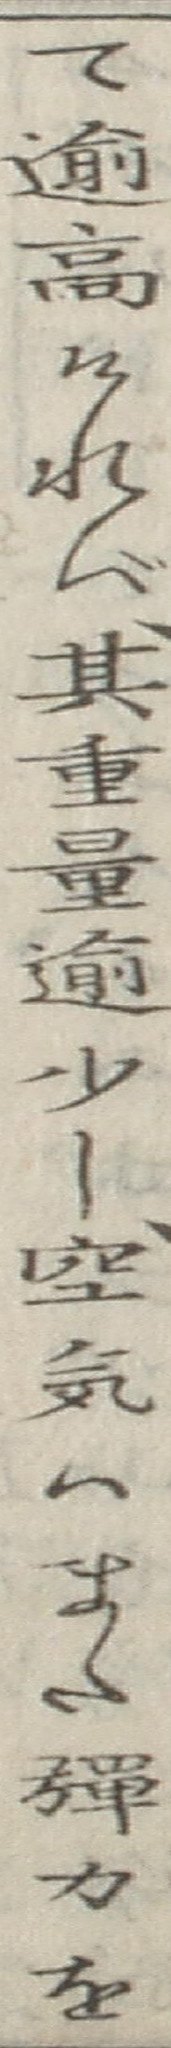て愈高ければ、其重量愈少し、空気はまた弾力を
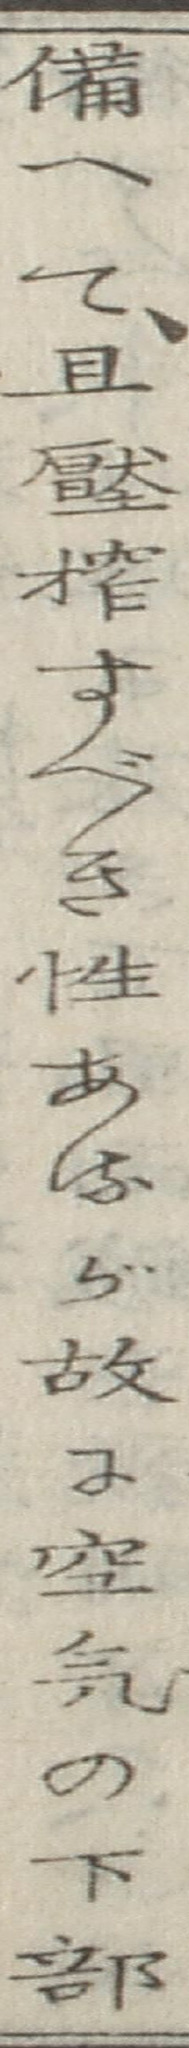備へて、且圧搾すべき性あるが故に、空気の下部
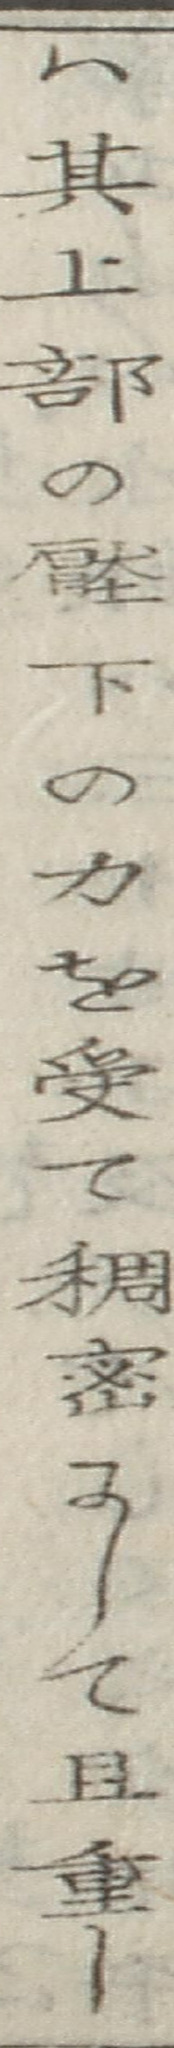は其上部の圧下の力を受て、稠密にして且重し
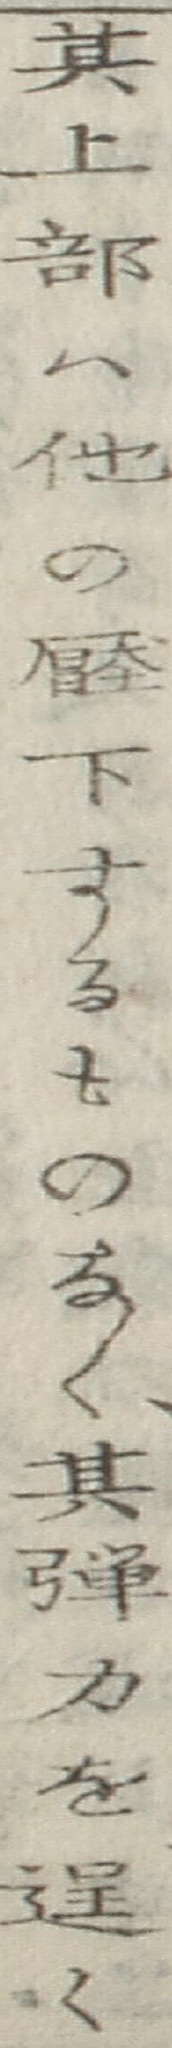其上部は他の圧下するものなく、其弾力を逞く
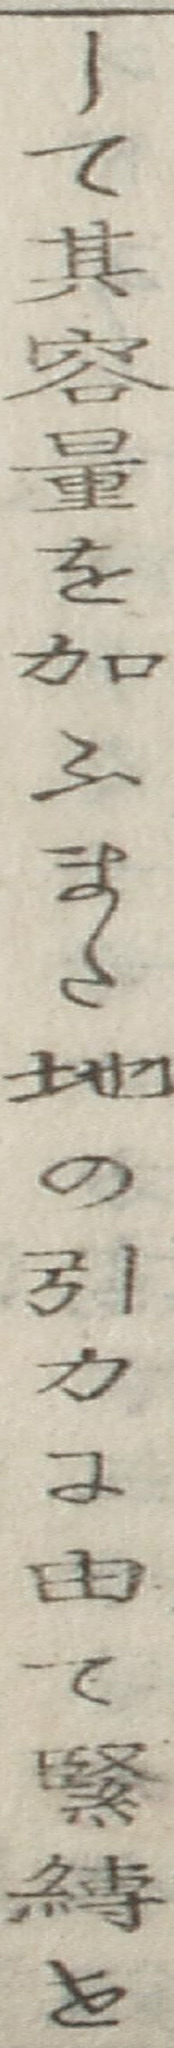して其容量を加ふ、また地の引力に由て緊縛せ
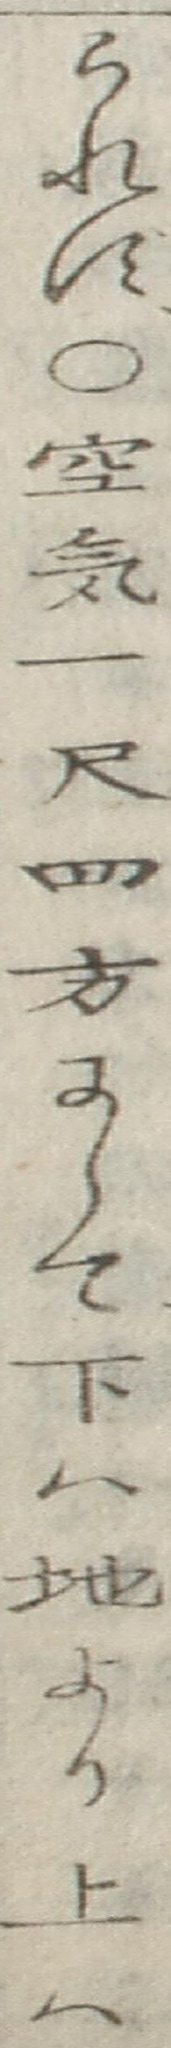られず、〇空気一尺四方にして、下は地より上は

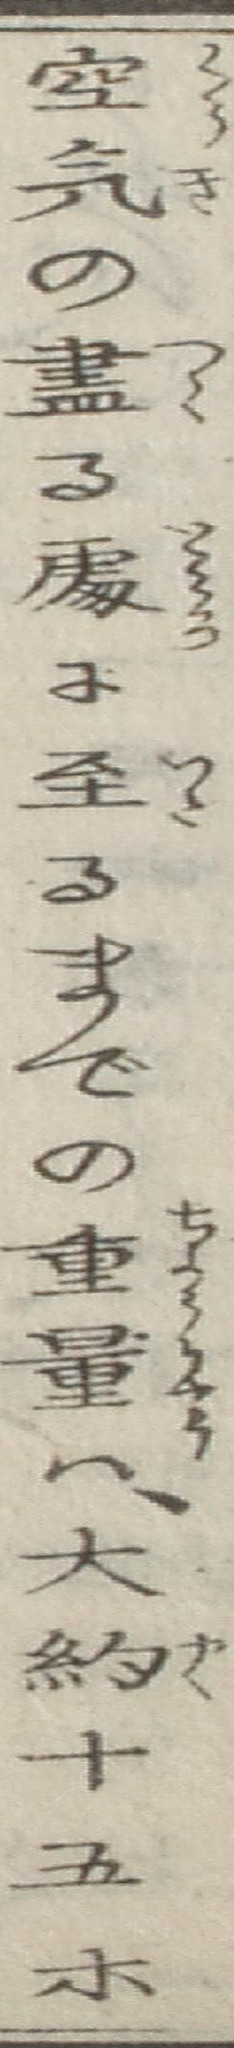空気の尽る処に至るまでの重量は、大約十五ホ
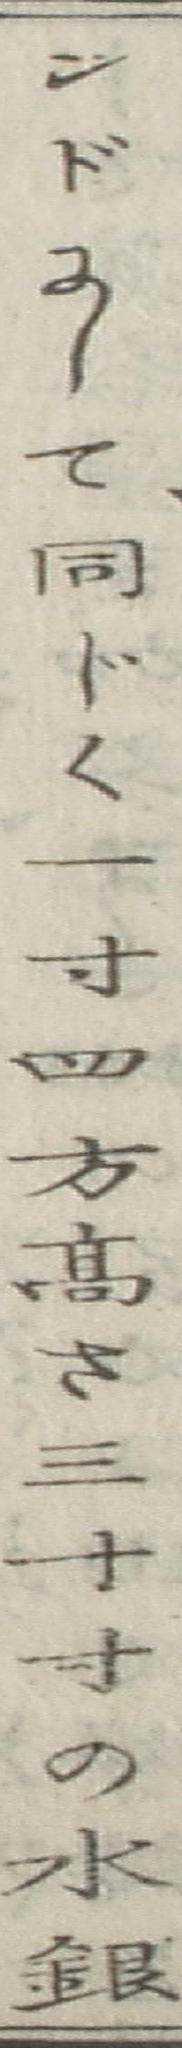ンドにして、同じく一寸四方高さ三十寸の水銀
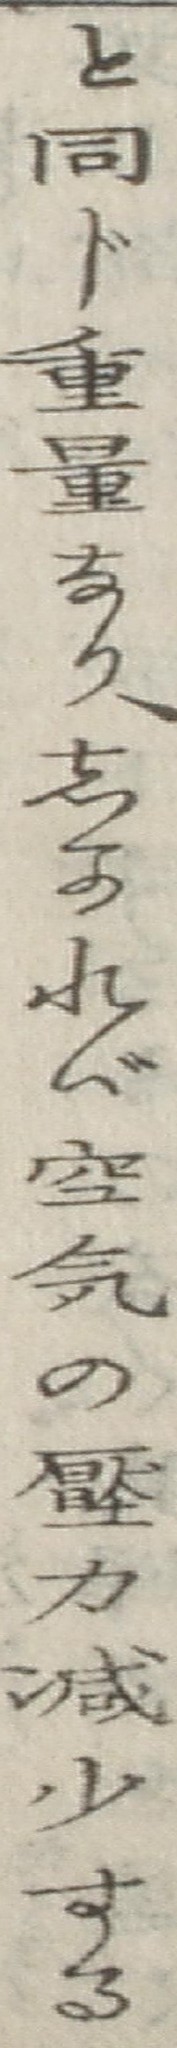と同じ重量なり、しかれば空気の圧力減少する
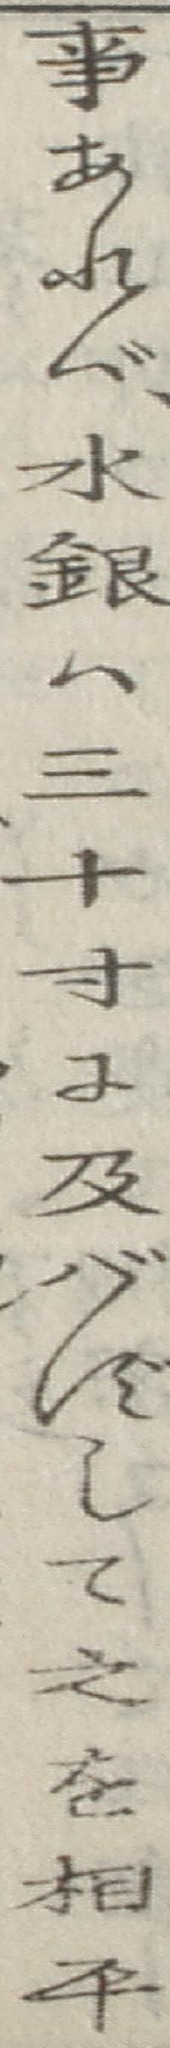事あれば、水銀は三十寸に及ばずして之を相平
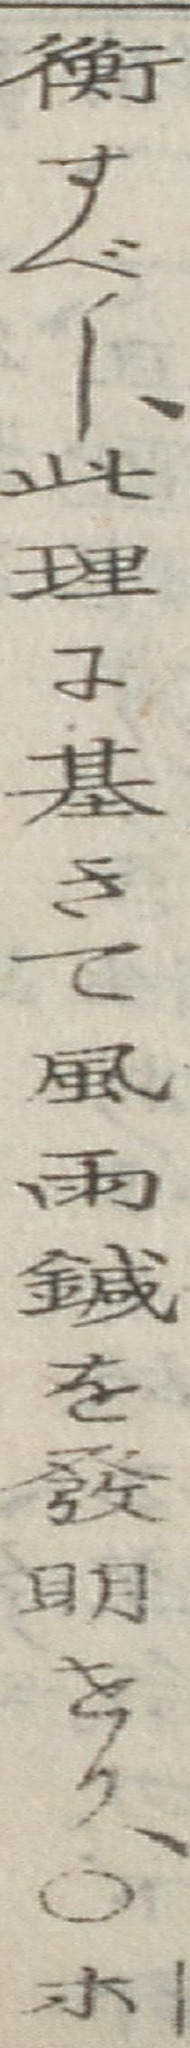衡すべし、此理に基きて風雨鍼を発明せり、〇ホ
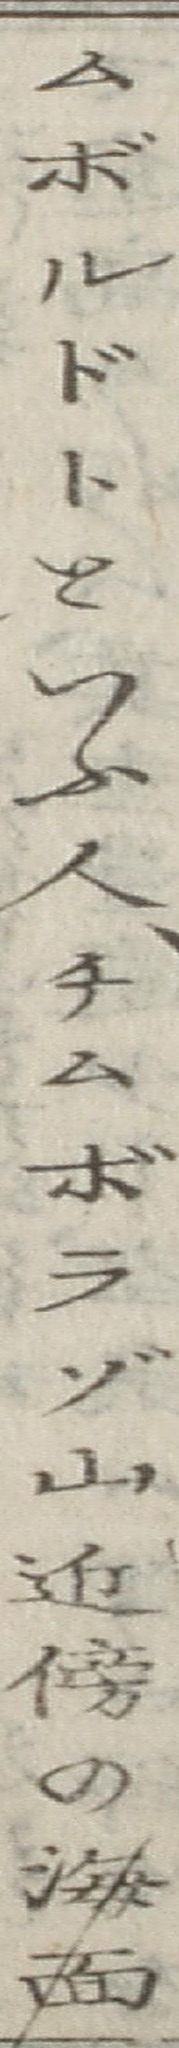ムボルドトといふ人、チムボラゾ山近傍の海面
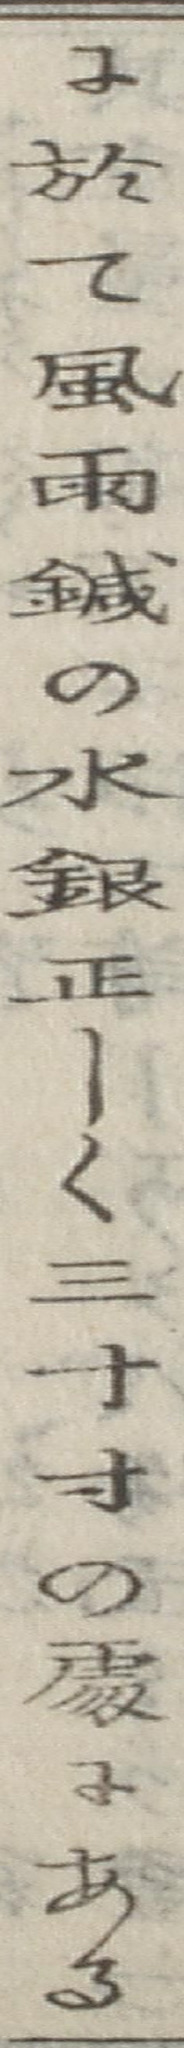に於て、風雨鍼の水銀正しく三十寸の処にある
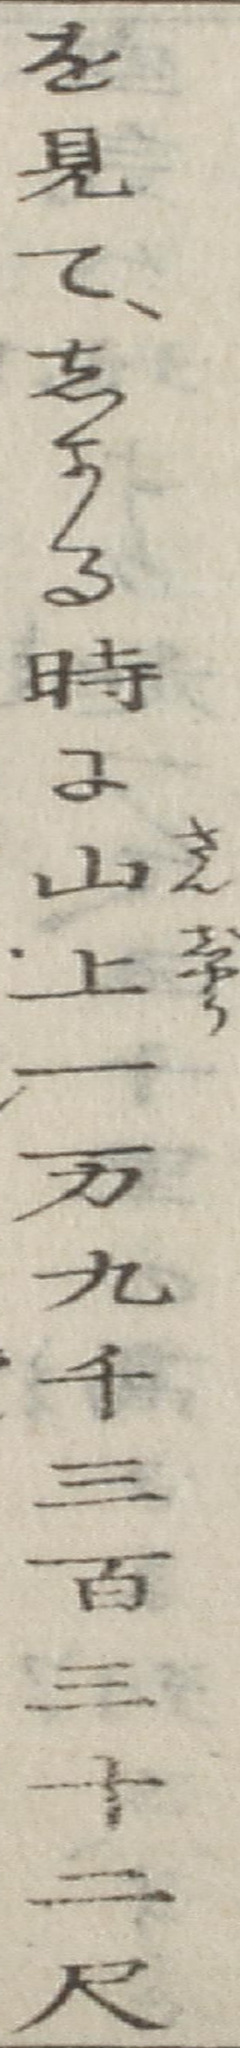を見て、しかる時に山上一万九千三百三十二尺
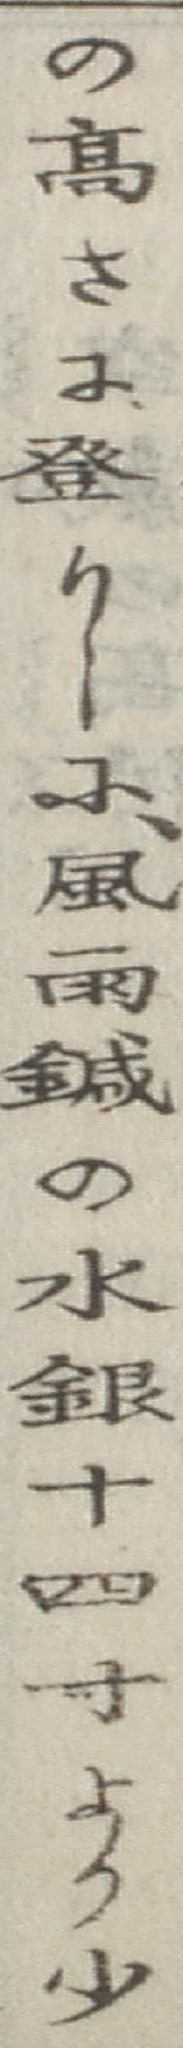の高さに登りしに、風雨鍼の水銀十四寸より少
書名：訓蒙　天然地理學　中
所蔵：東京大学地震研究所図書室 Earthquake Research Institute Library, The University of Tokyo, JAPAN
